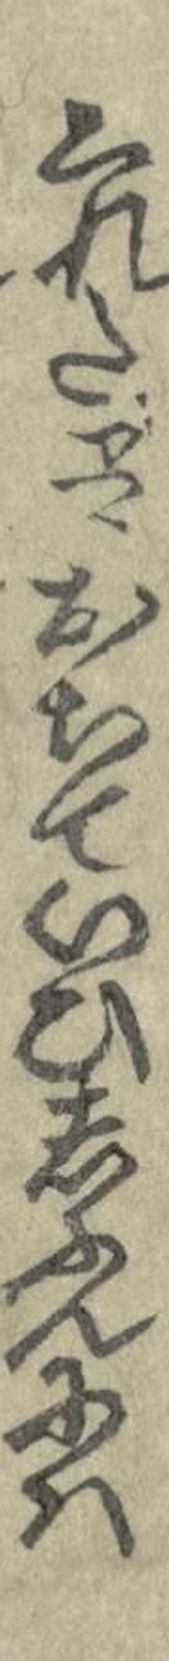くれたゑゝおちていひしふんには
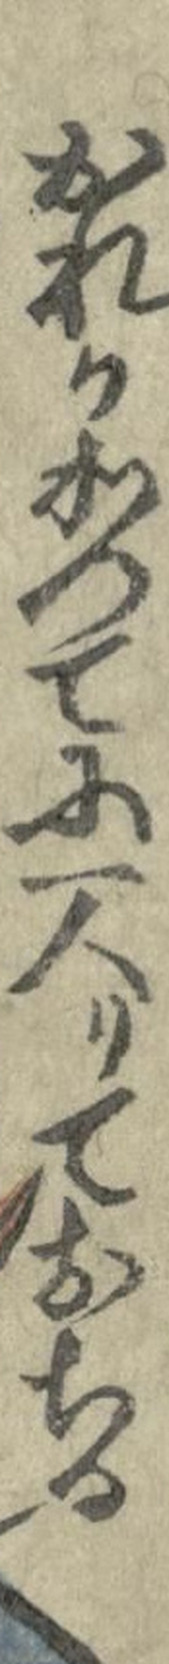おれかかつてに一人りておちる
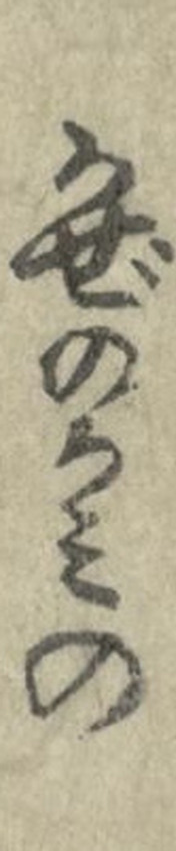かぜのかみの
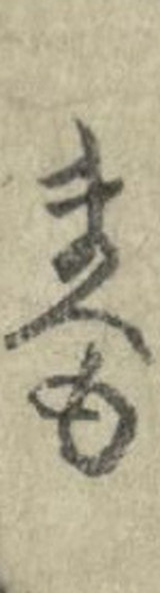まへも
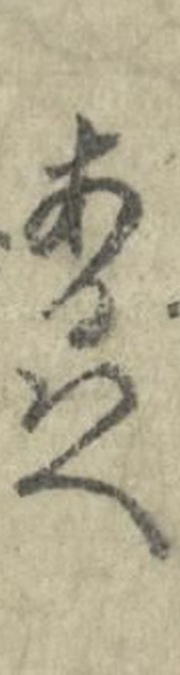あるはへ
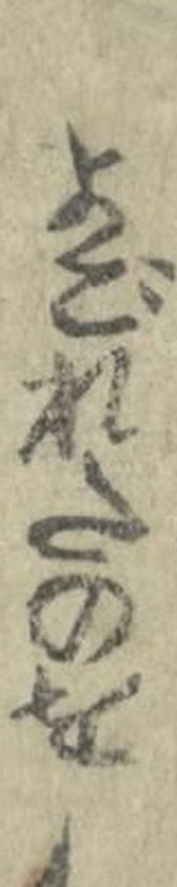よごれたのを
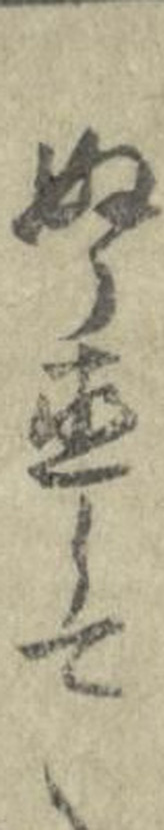ぬり直して
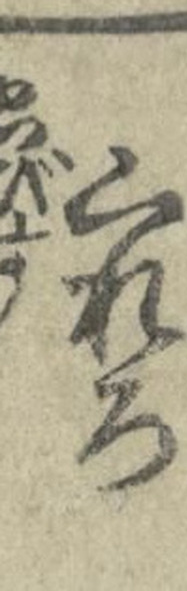くれろ
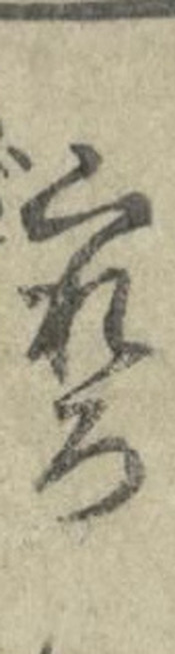くれろ
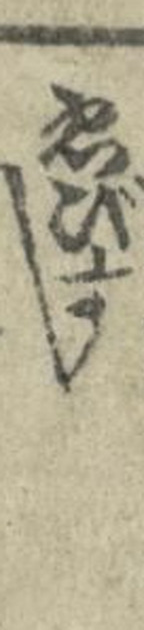ゑびす
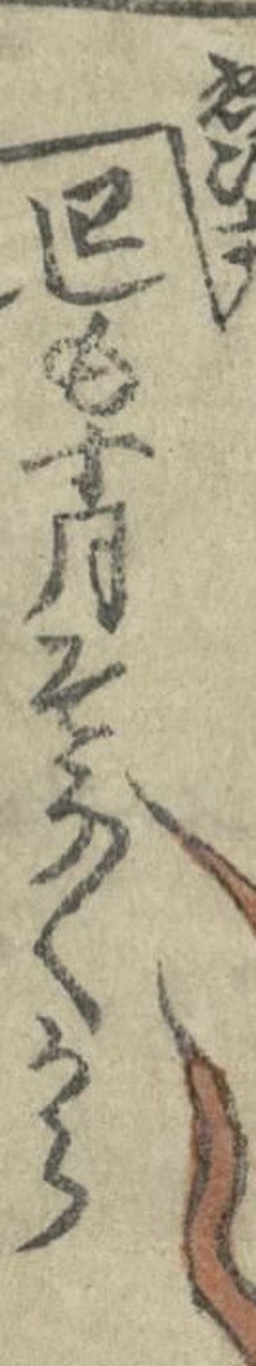〽わしも十月そう〳〵から
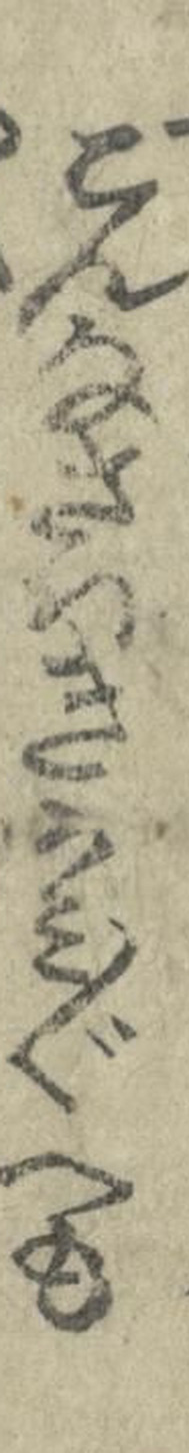こんなさはきかみ〴〵へも
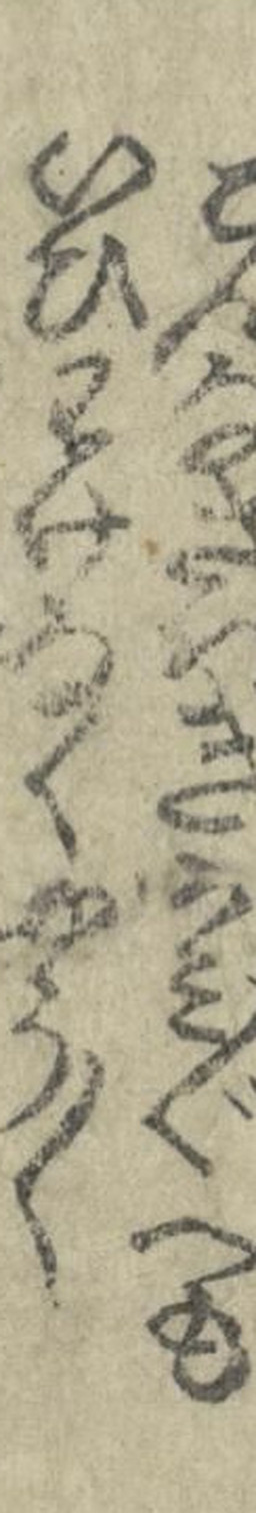いひわけなくやう〳〵
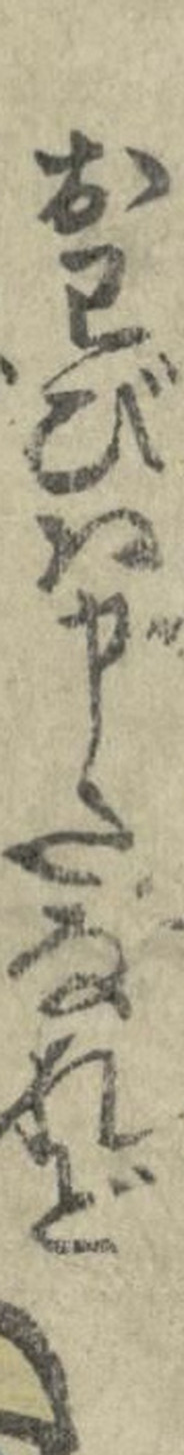おわびは申さなれど
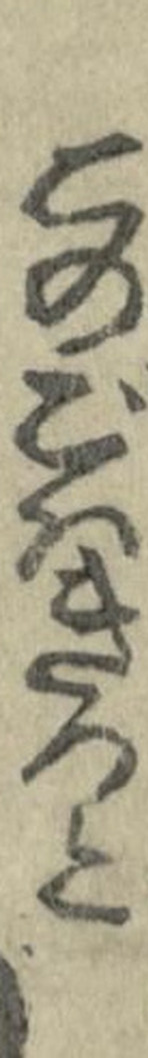このごはきつと
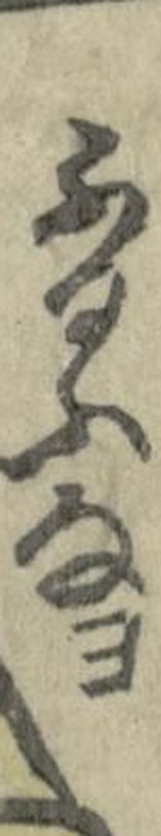ふるふなよ
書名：差出し申御詫一札之事
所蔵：東京大学地震研究所図書室 Earthquake Research Institute Library, The University of Tokyo, JAPAN
